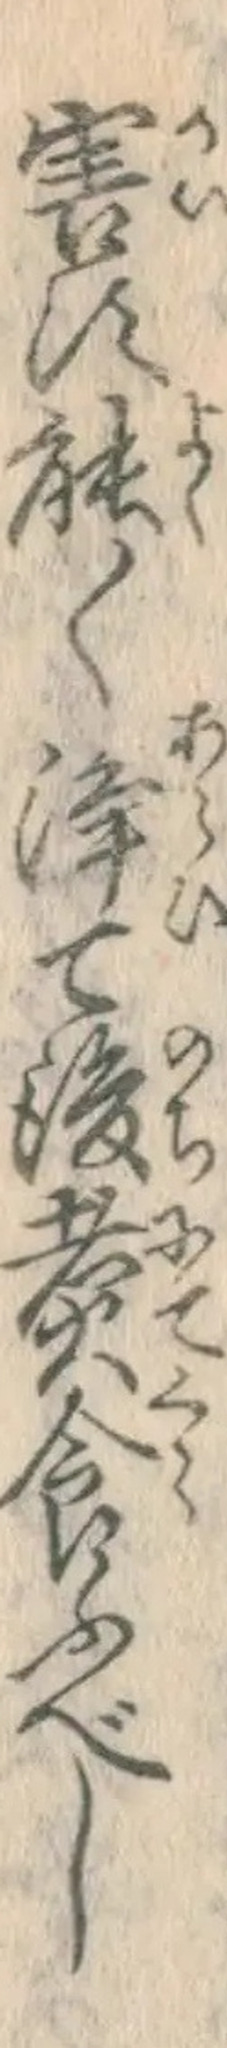害す能〳〵浄て後煑食ふべし
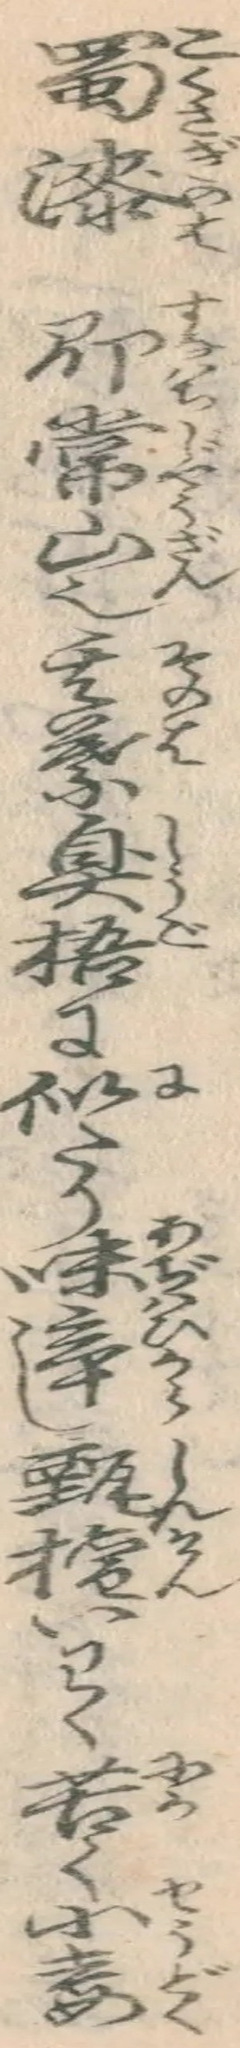蜀漆即常山也其葉臭梧に似たり味辛し甄権いわく苦く小毒
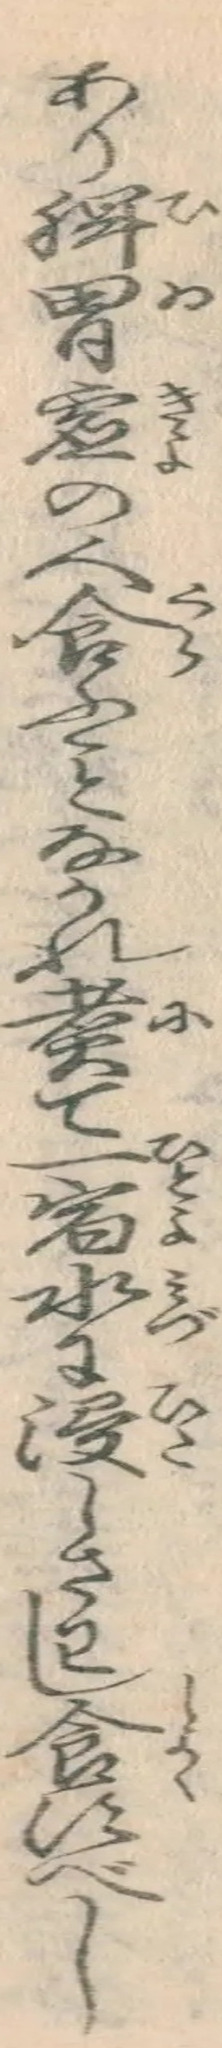あり腗胃虚の人食ふことなかれ煑て一宿水に浸しさわし食すべし
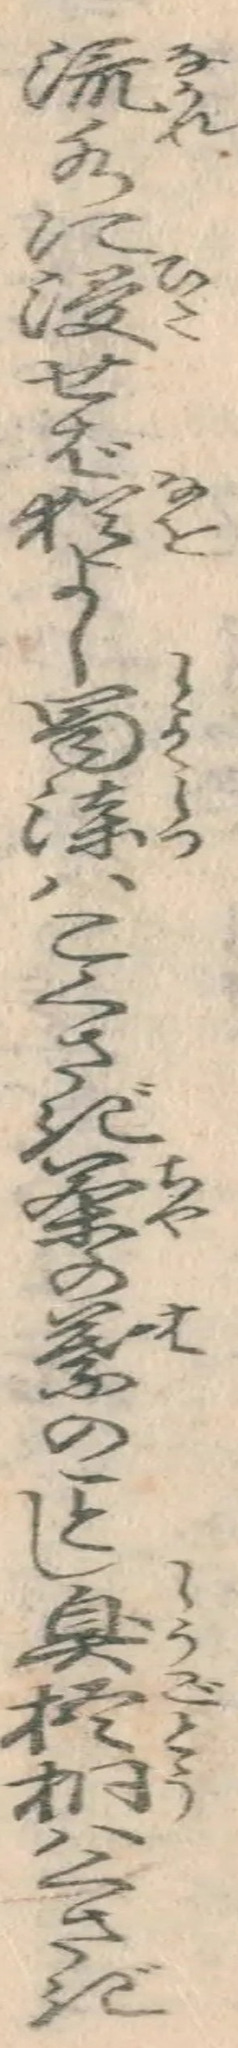流水に浸せば猶よし蜀漆はこくさぎ茶の葉のことし臭梧桐はくさぎ
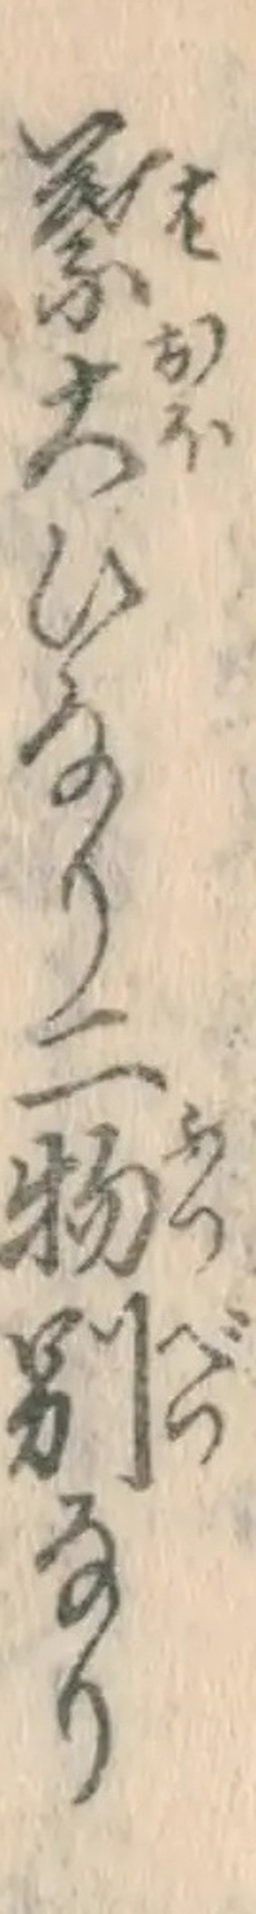葉大ひなり二物別なり
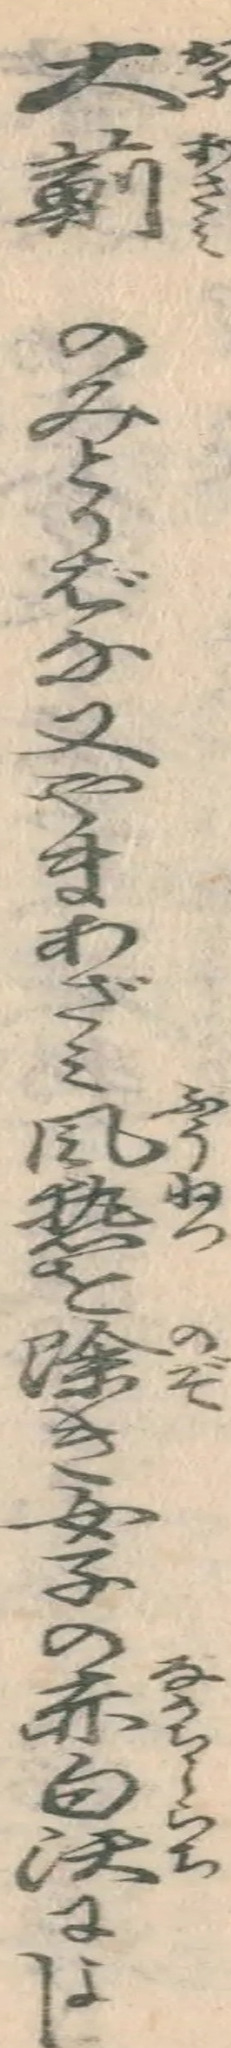大薊のみとりばな又やまあざみ風熱を除き女子の赤白沃によし
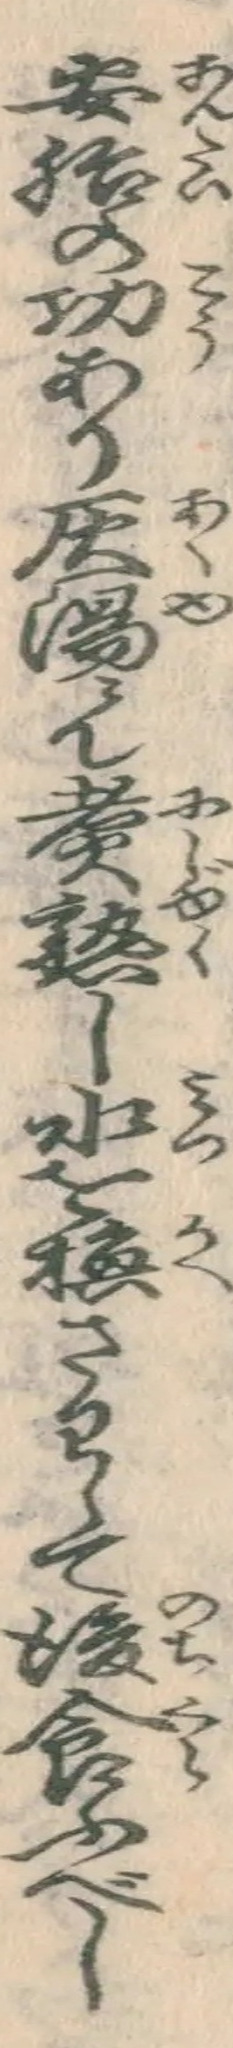安胎の功あり灰湯にて煑熟し水を換さわして後食ふべし
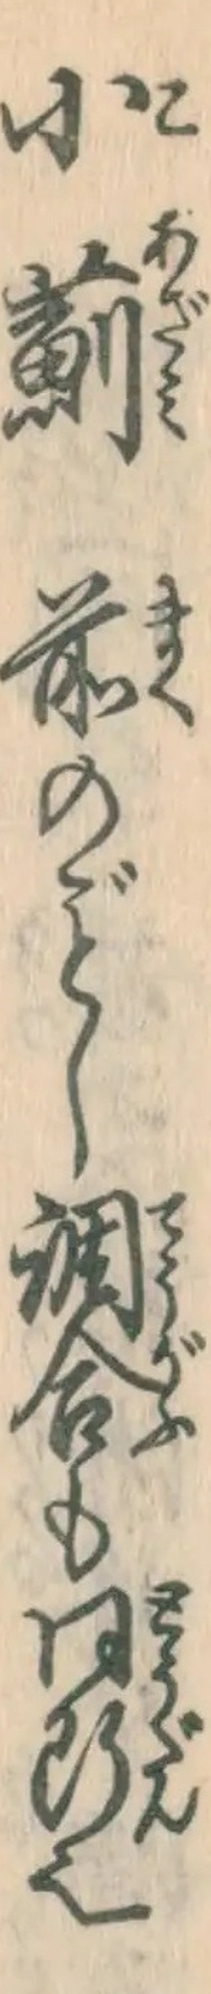小薊前のごとし調合も同断也
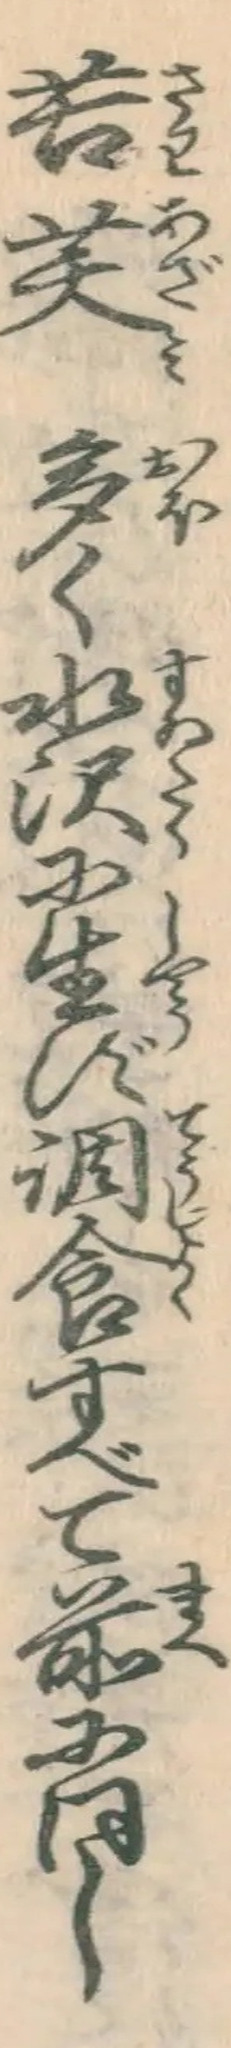苦芺多く水沢に生ず調食すべて前に同し
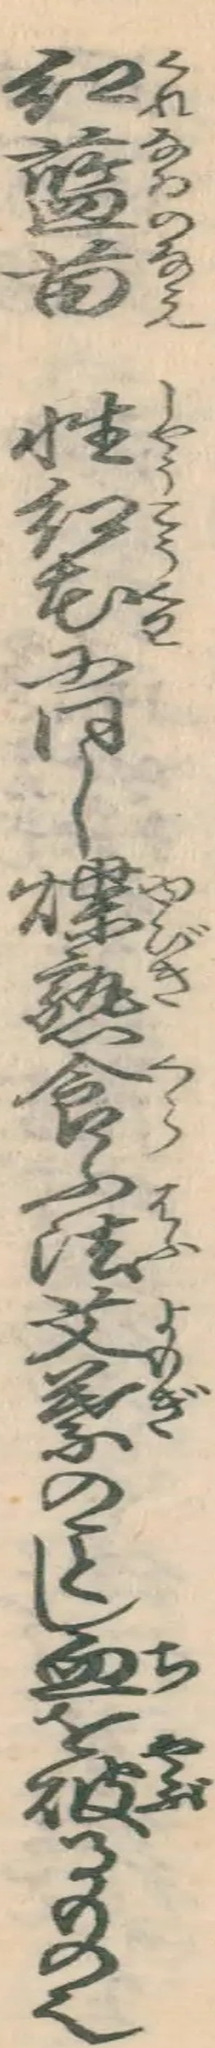紅藍苗性紅花に同し煠熟食ふ法艾葉のことし血を破るもの也
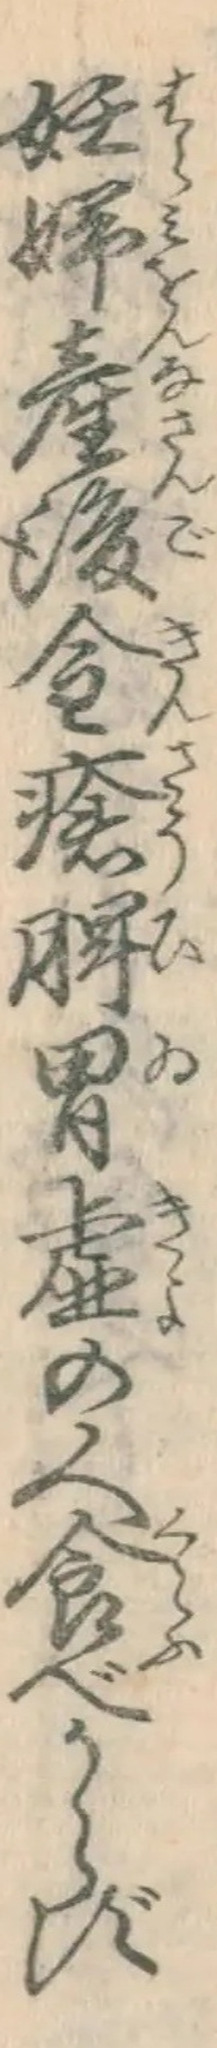妊婦産後金瘡脾胃虚の人食べからず
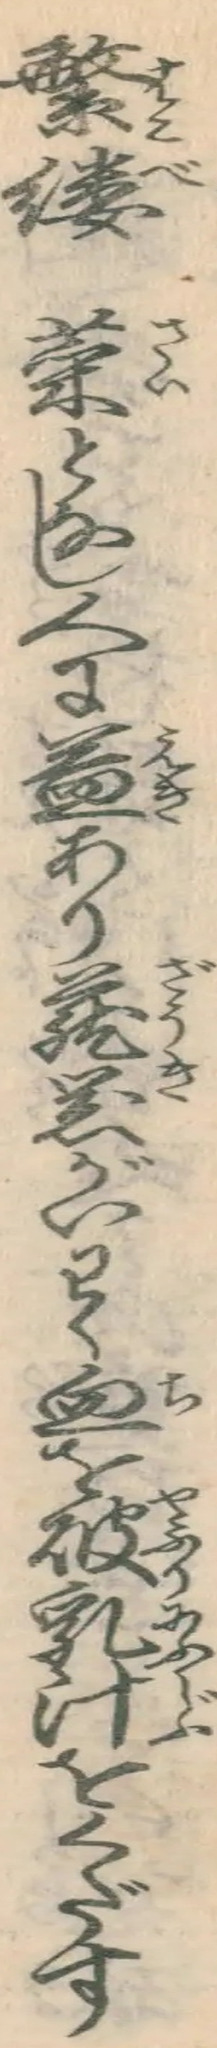繁縷菜となし人に益あり蔵器がいわく血を破乳汁をくだす
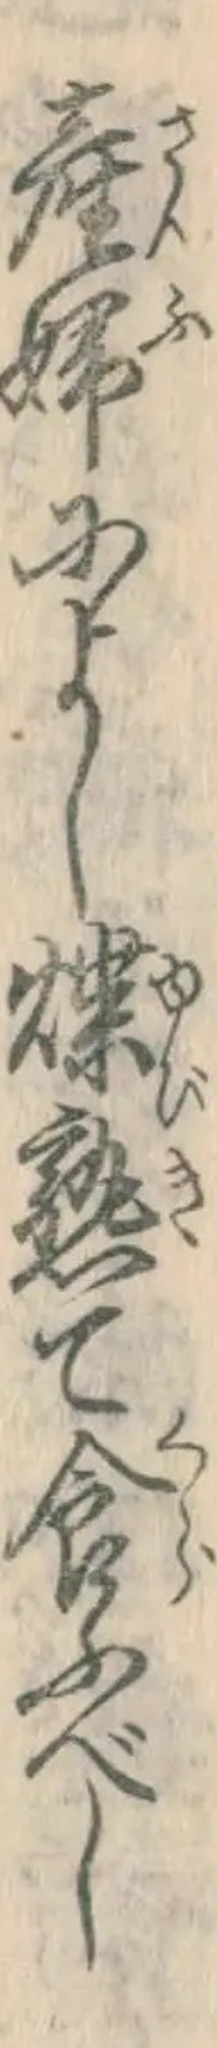産婦によし煠熟て食ふべし
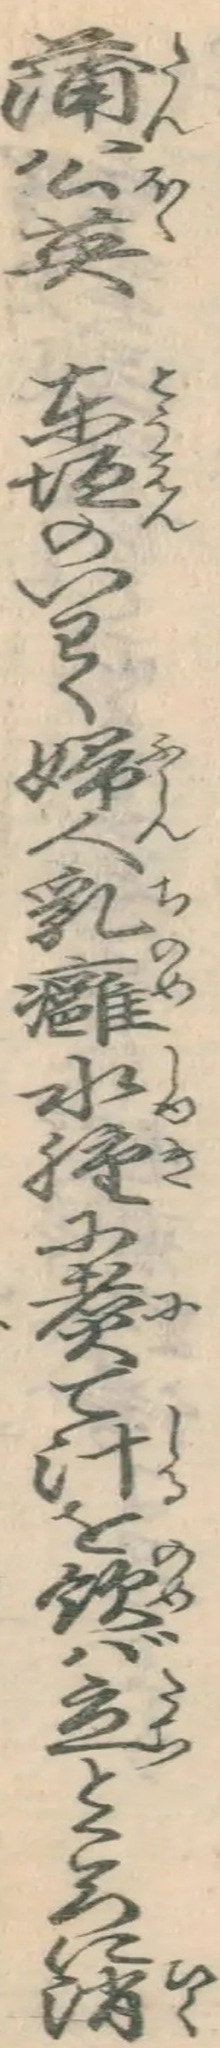蒲公英東垣のいわく婦人乳癰水腫に煮て汁を飲ば立ところに消
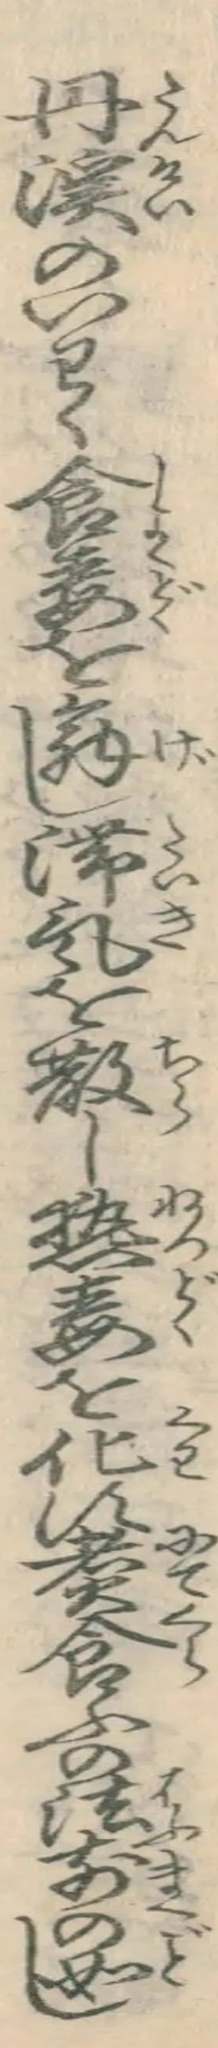丹渓のいわく食毒を解し滞気を散し熱毒を化す煑食ふの法前の如し
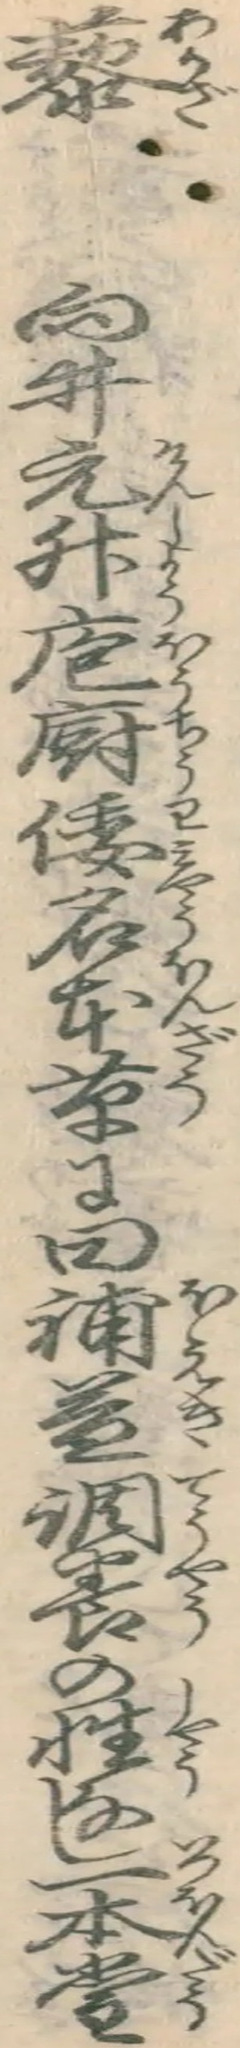藜向井元升庖厨倭名本草に曰補益調養の性なし一本堂
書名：経済をしへ草
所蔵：国立国会図書館 National Diet Library, JAPAN
